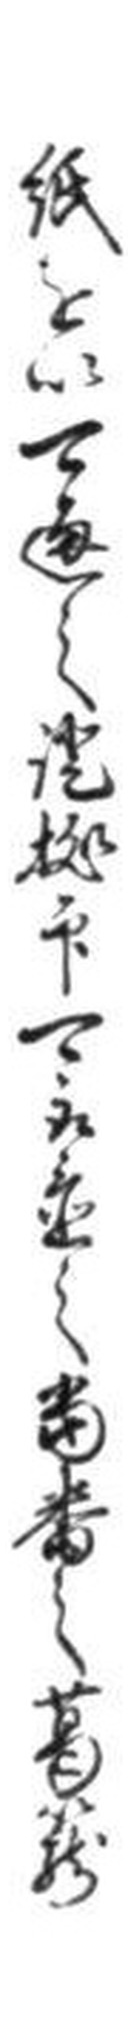紙を以可通之証拠印可取置之当番之葛籠
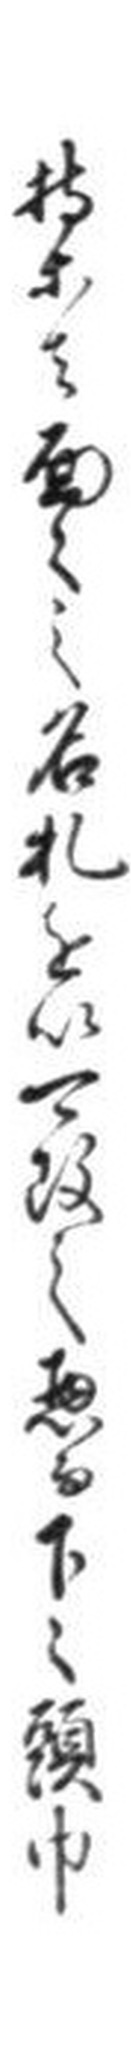持等者面々之名札を以可改之惣而下々頭巾
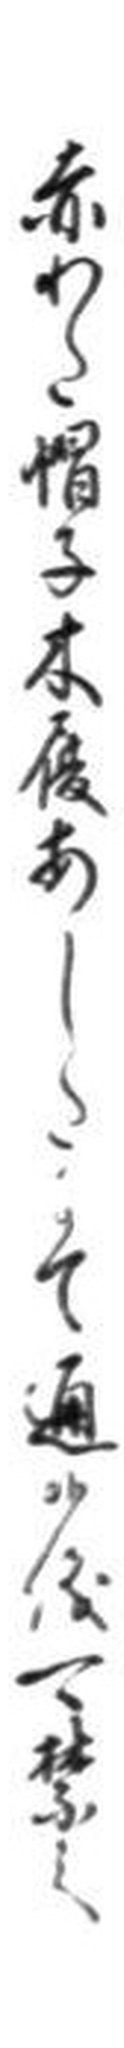赤わた帽子木履あしたにて通候儀可禁之
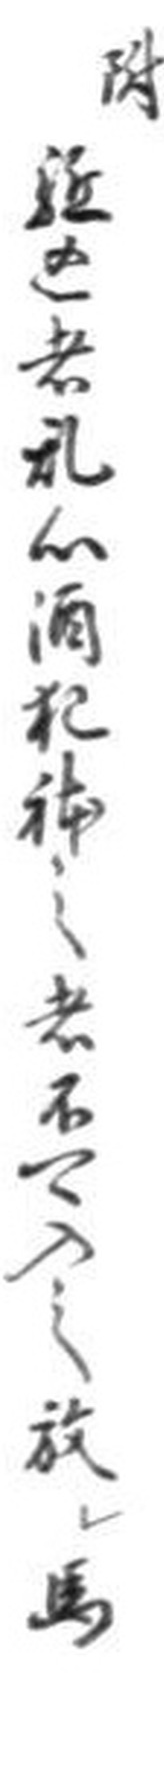駈込者乱心酒狂体之者不可入之放レ馬
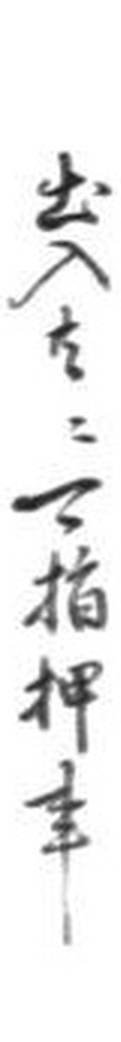出入共ニ可指押事
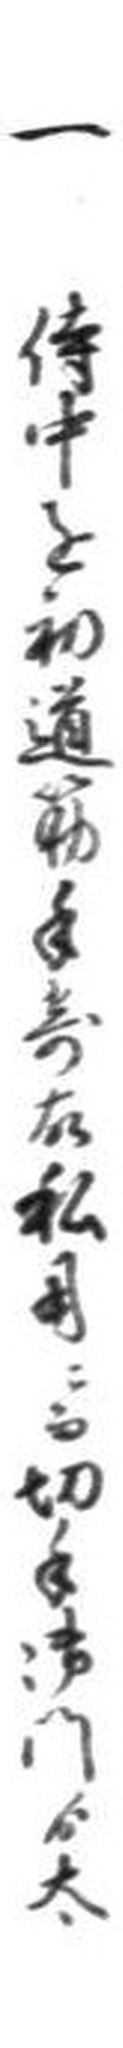一侍中を初道筋手寄故私用ニ而切手御門ゟ太
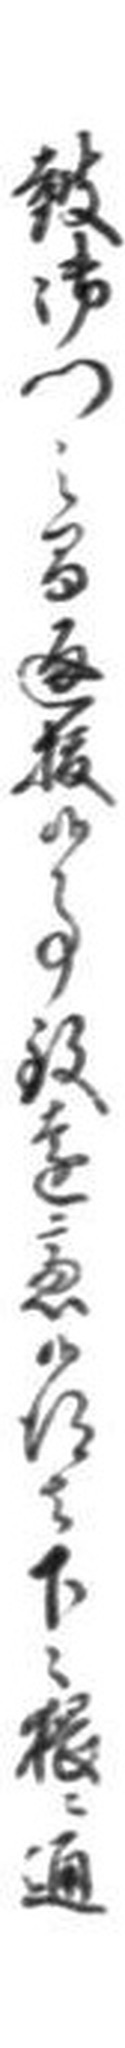鼓御門之間通抜候事致遠慮候得者下々猥ニ通
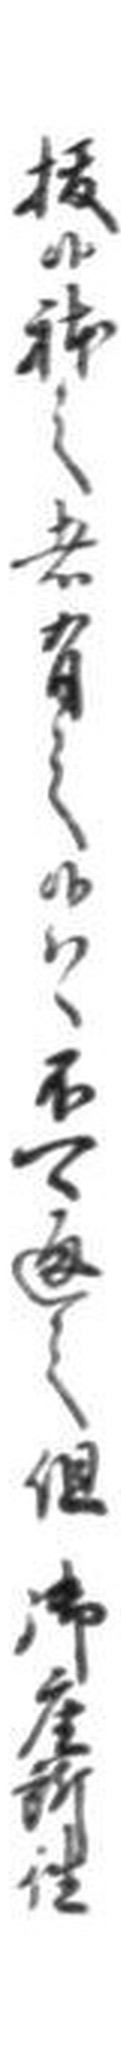抜候体之者有之候ハヽ不可通之但御座所往
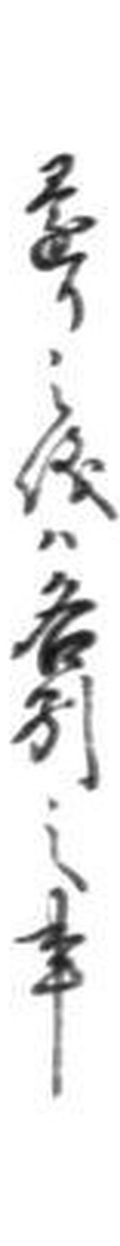還り之儀ハ各別之事
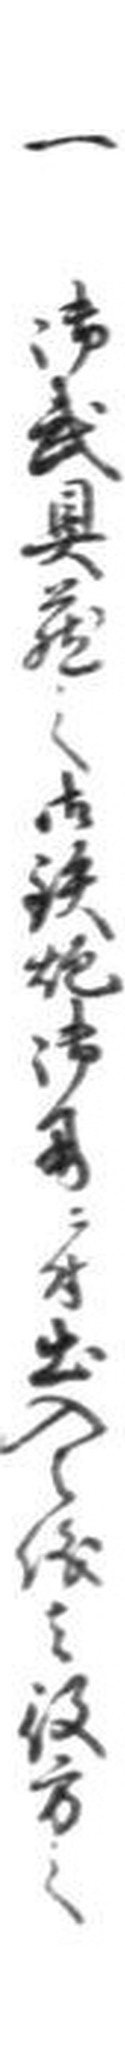一御武具蔵之御鉄炮御用ニ付出入之儀者役方之

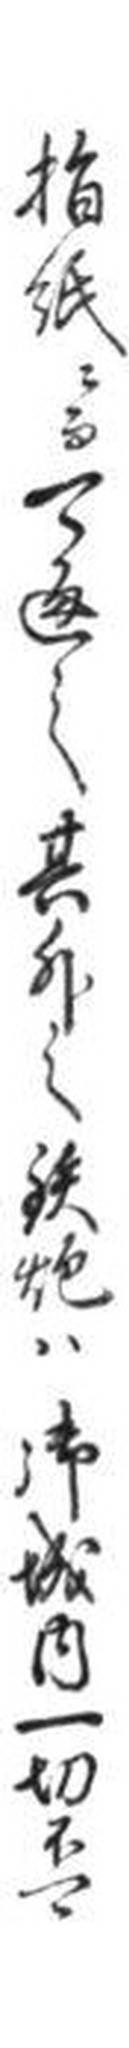指紙ニ而可通之其外之鉄炮ハ御城内一切不可
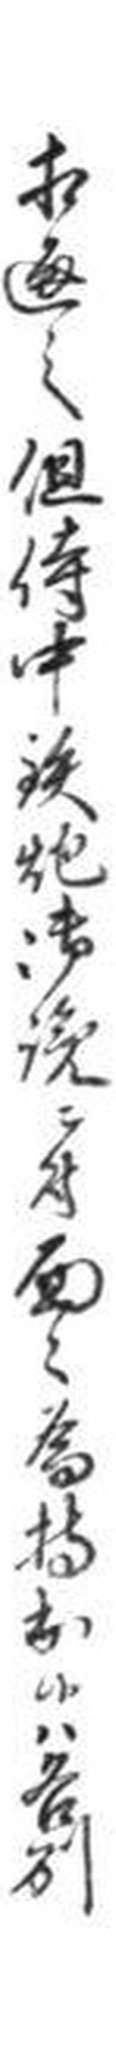相通之但侍中鉄炮御覧ニ付面々為持出候ハ各別
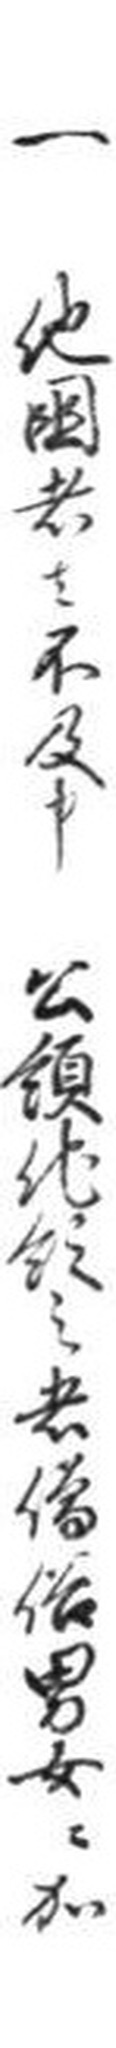一他国者者不及申公領他領之者僧俗男女ニか
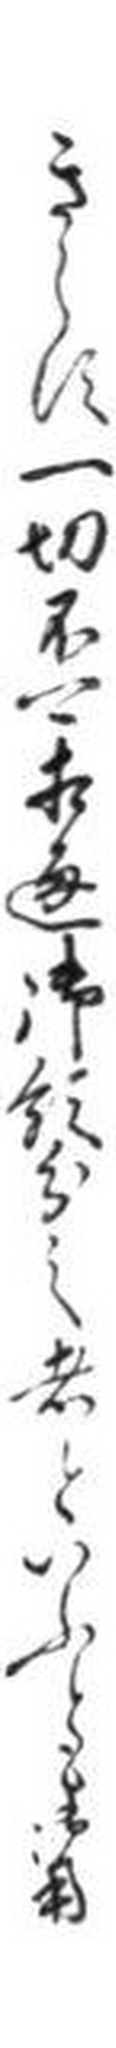きらす一切不可相通御領分之者といふとも御用
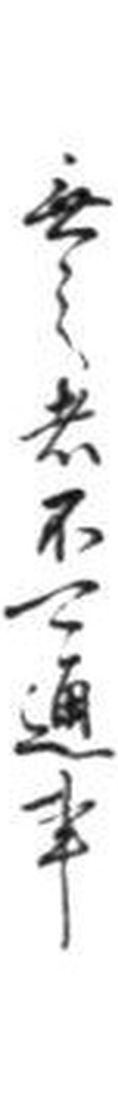無之者不可通事
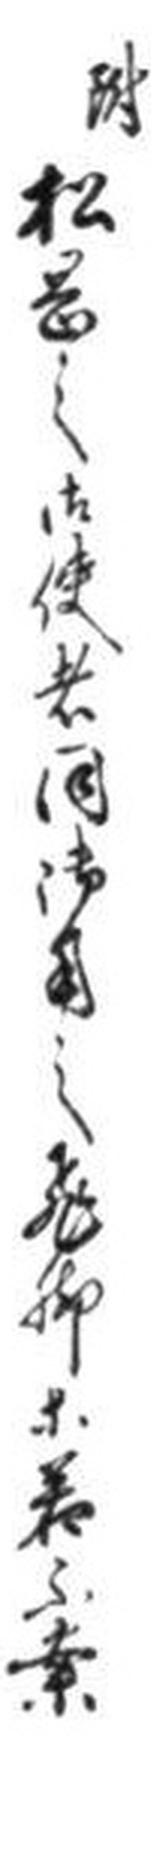松岡之御使者同御用之飛脚等若不案
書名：家譜 三十三 吉邦公 享保四年
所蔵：福井県文書館 Fukui Prefectural Archives
